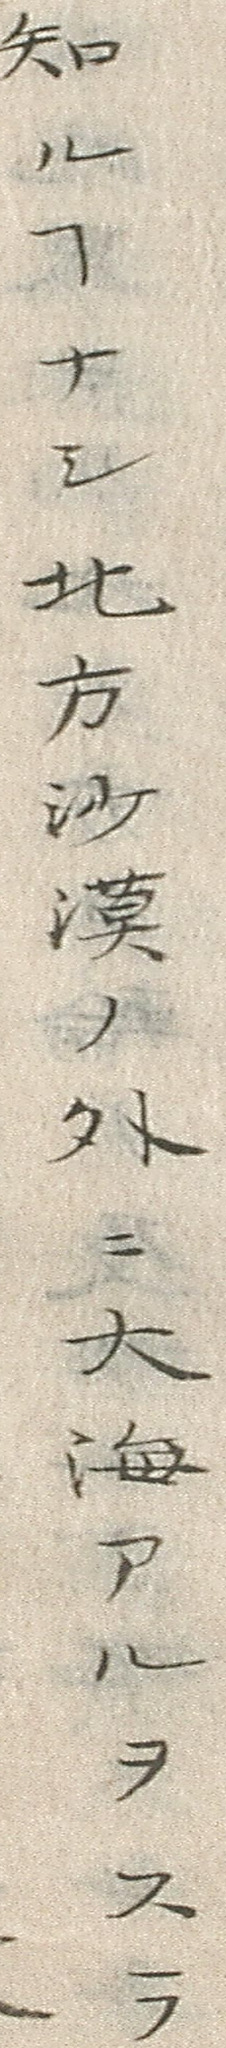知ルコトナシ北方沙漠ノ外ニ大海アルヲスラ
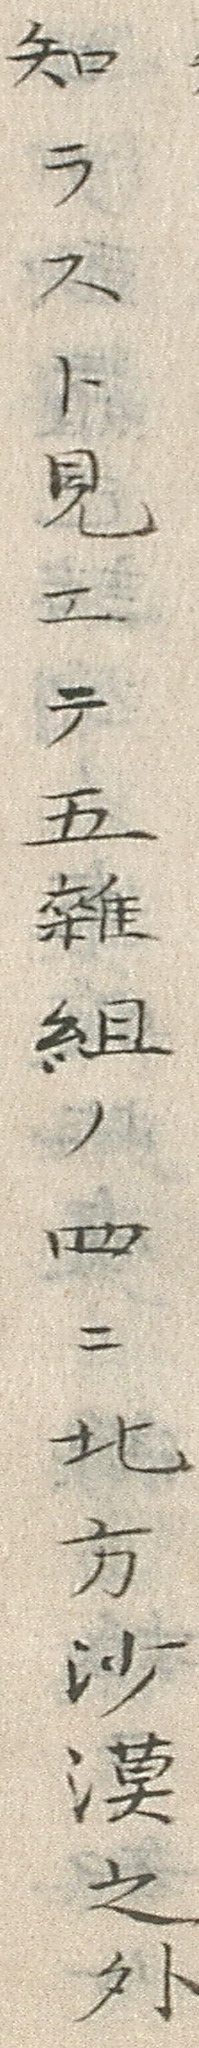知ラスト見エテ五雑組ノ四ニ北方沙漠之外
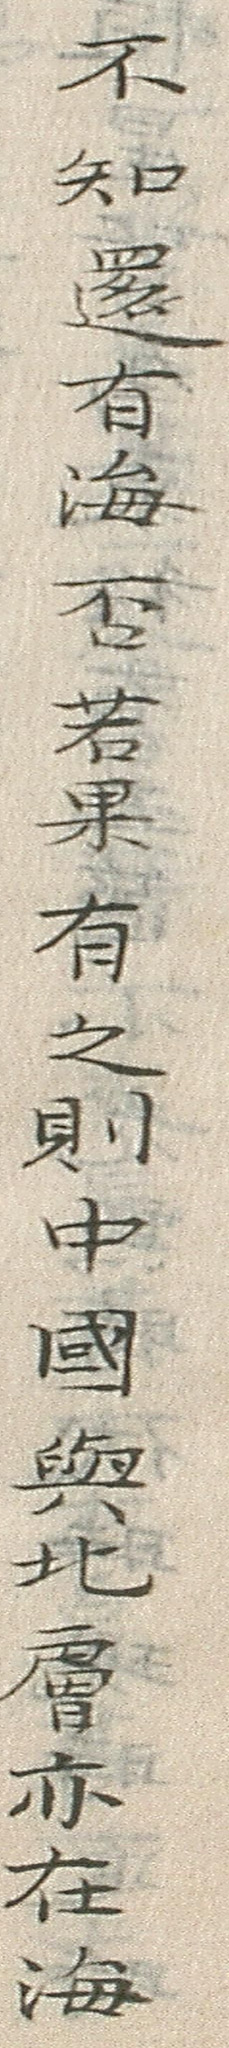不知遝有海否若果有之則中国与北膚亦在海
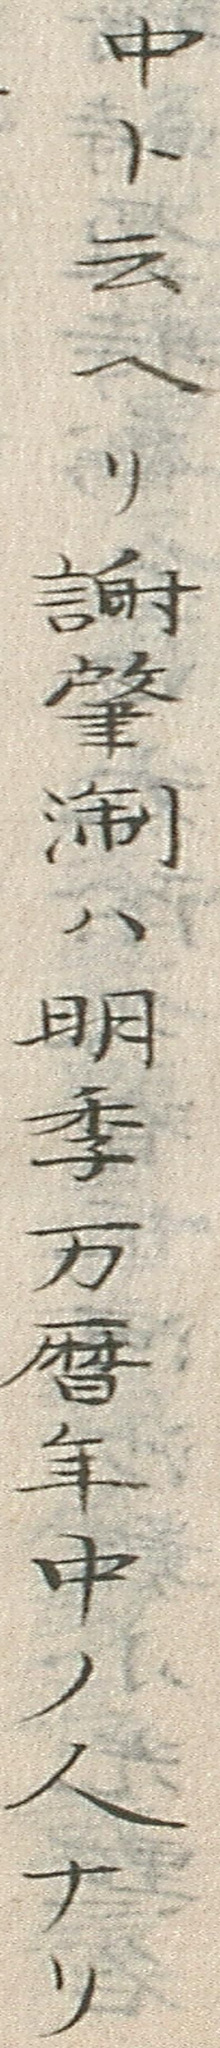中ト云ヘリ謝肇淛ハ明季万暦年中ノ人ナリ
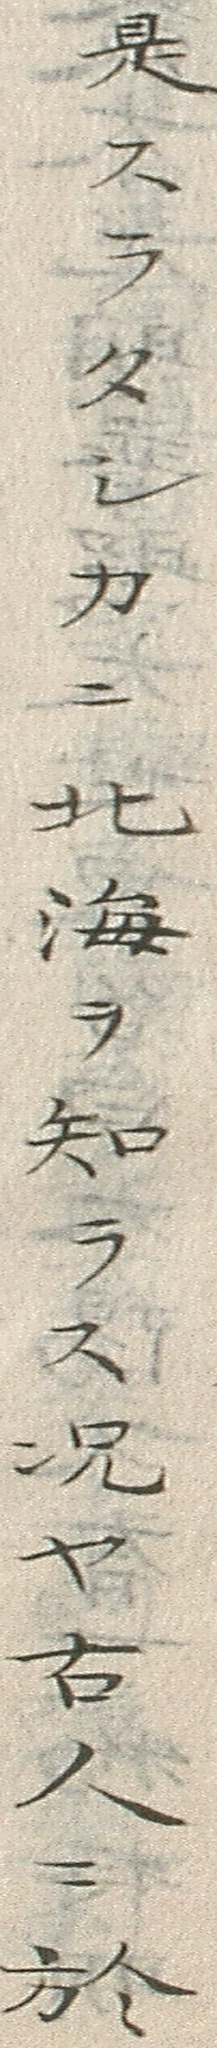是スラタシカニ北海ヲ知ラス況ヤ古人ニ於
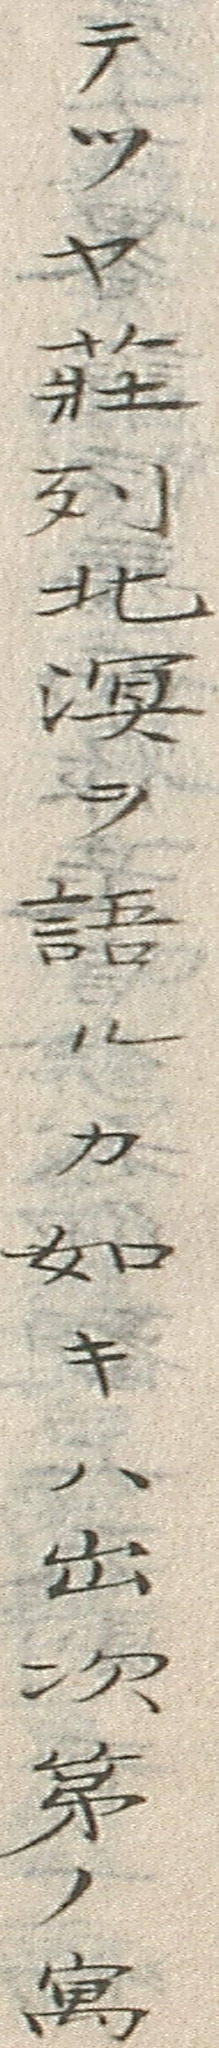テヲヤ荘列北溟ヲ語ルカ如キハ出次第ノ寓
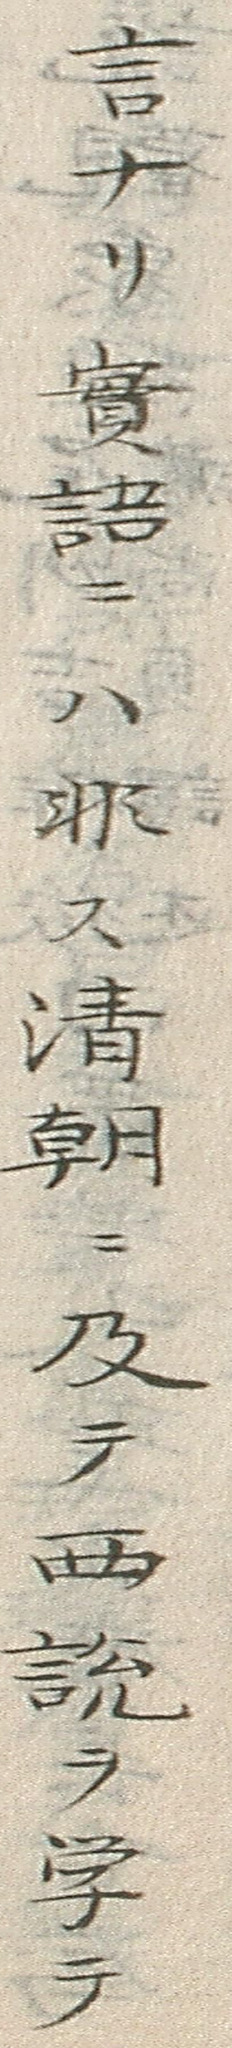言ナリ実語ニハ非ス清朝ニ及テ西説ヲ学テ
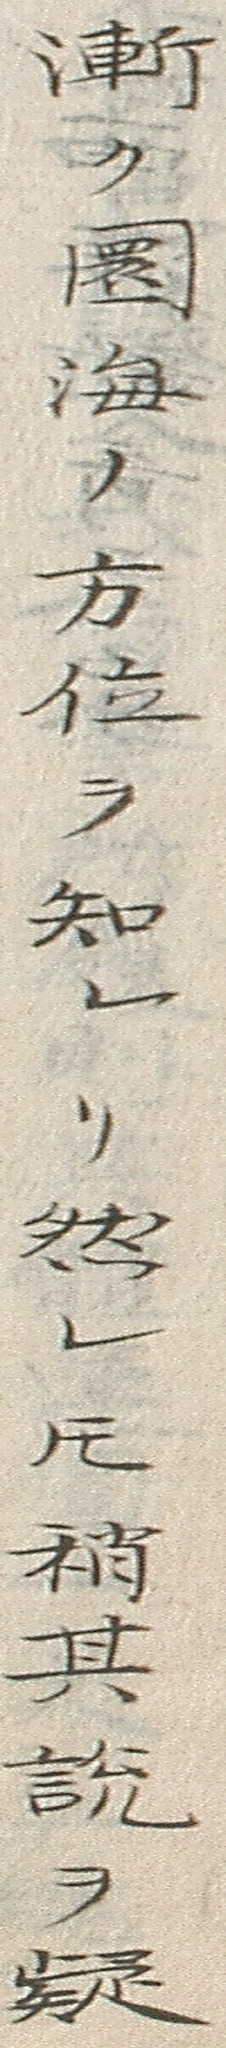漸ク圜海ノ方位ヲ知レリ然レトモ稍其説ヲ疑
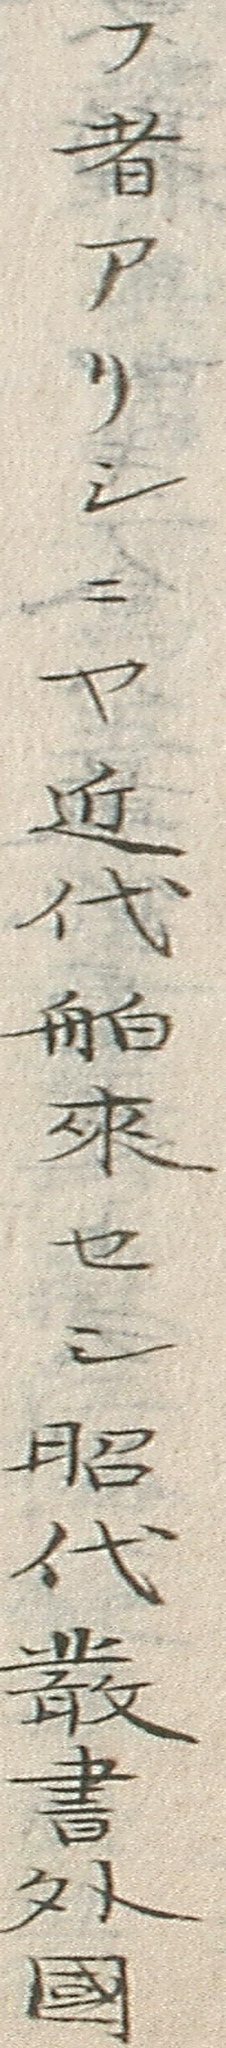フ者アリシニヤ近代舶来セシ昭代叢書外国
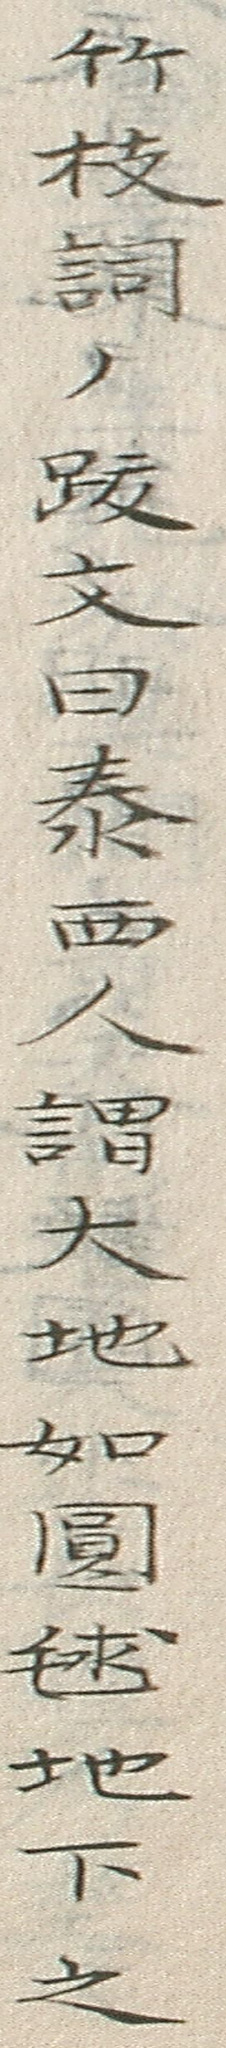竹枝詞ノ跋文曰泰西人謂大地如円毬地下之
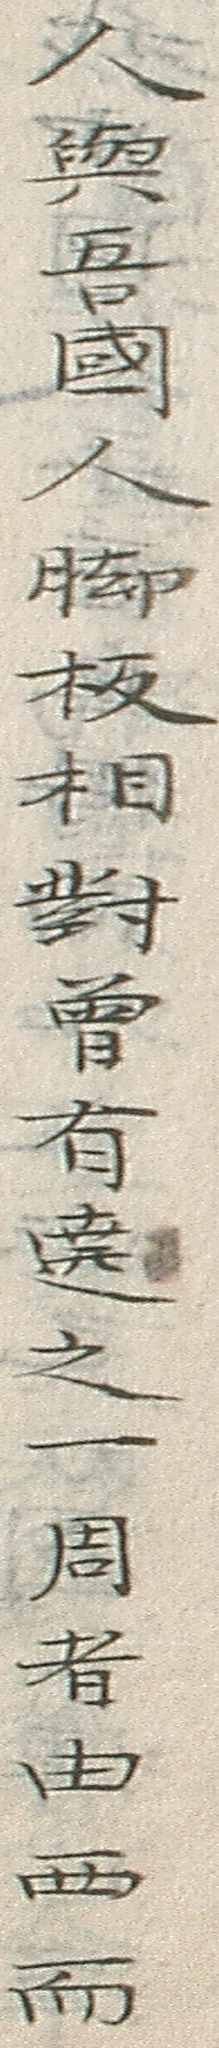人予吾国人脚板相対曽有遶之一周者由西而
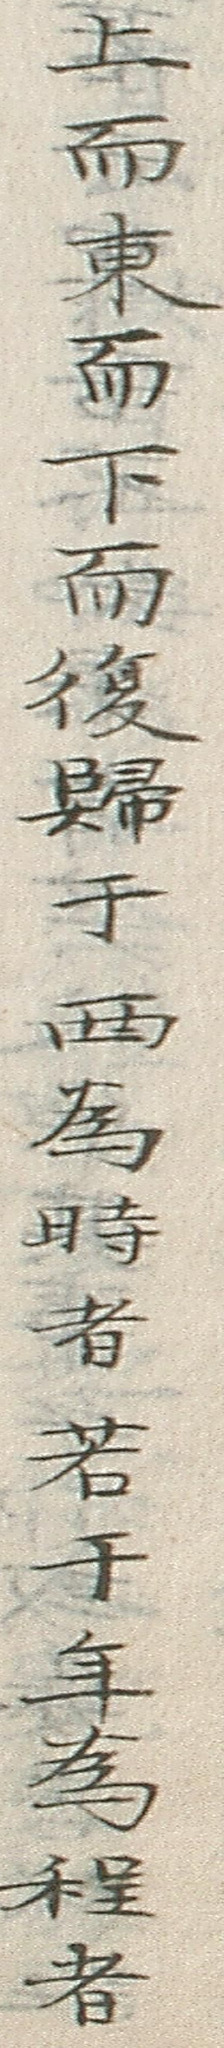上而東而下而復帰于西為時者若干年為程者

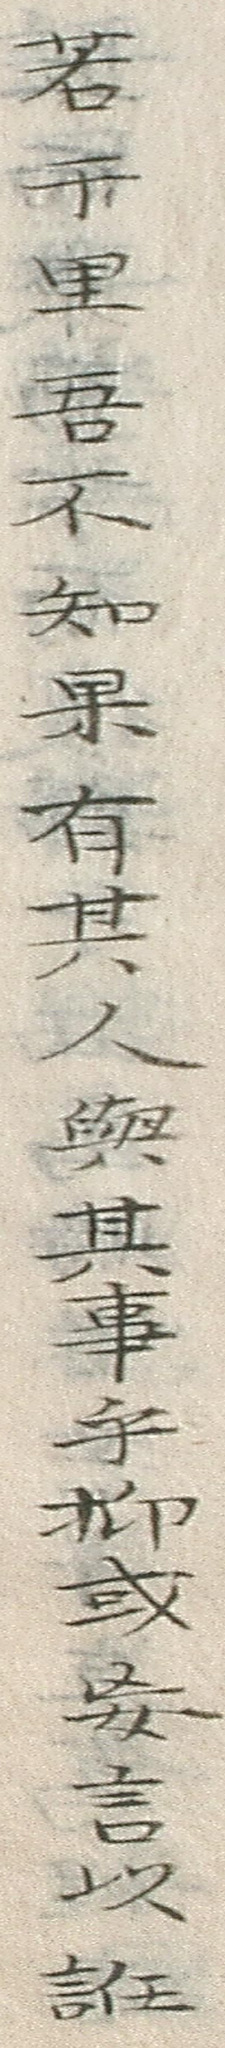若干里吾不知果有其人与其事乎抑或妄言以誑
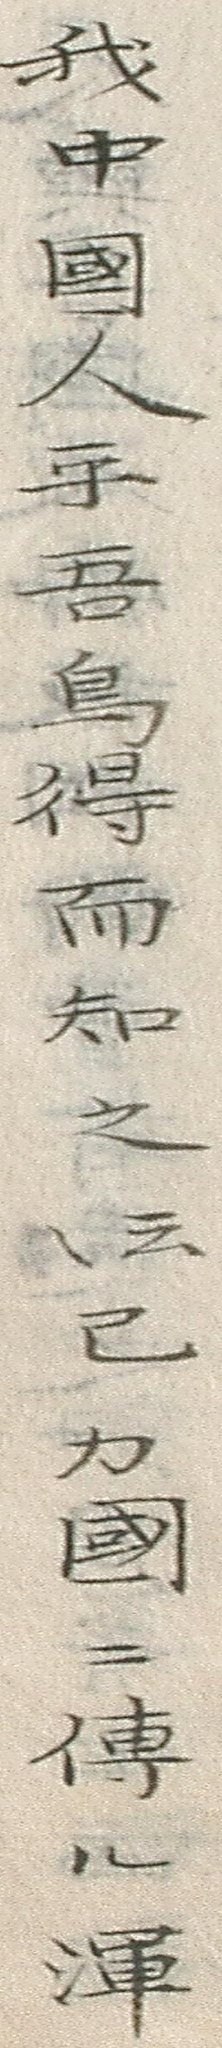我中国人乎吾島得而知之云〻己カ国ニ伝ル渾
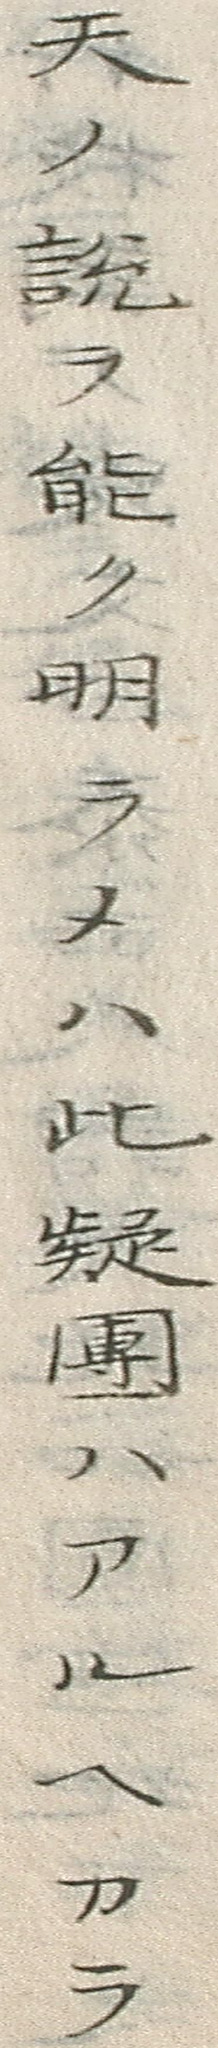天ノ説ヲ能ク明ラメハ此疑団ハアルヘカラ
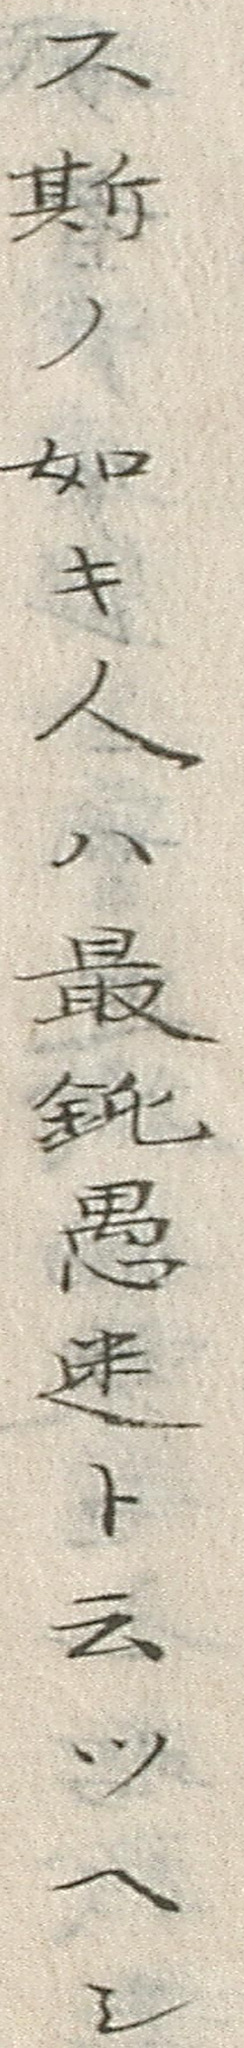ス斯ノ如キ人ハ最鈍愚迷ト云ツヘレ
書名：天學略名目羽翼　全
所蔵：東京大学地震研究所図書室 Earthquake Research Institute Library, The University of Tokyo, JAPAN
